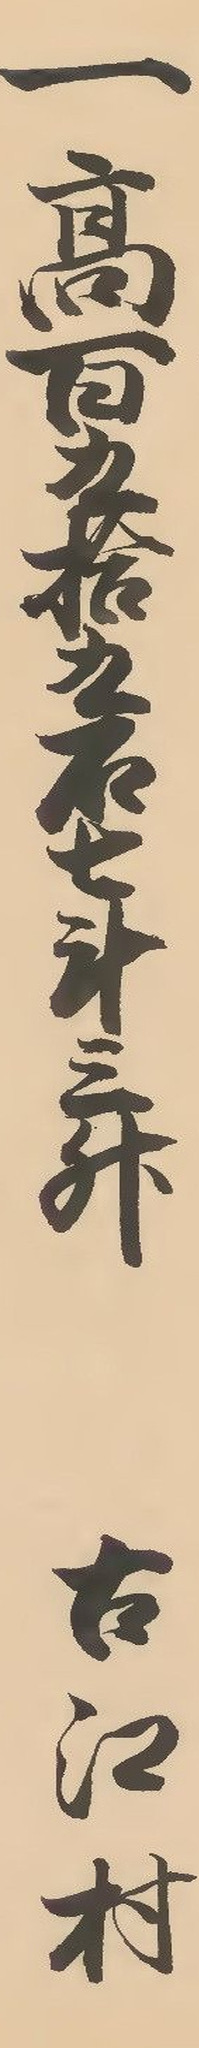一髙百九拾九石七斗三升古江村
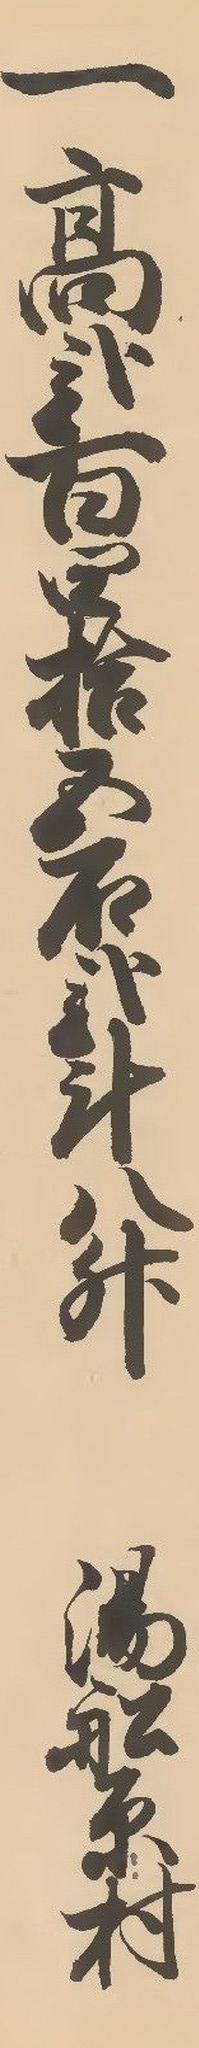一髙弐百四拾五石弐斗八升湯舩原村
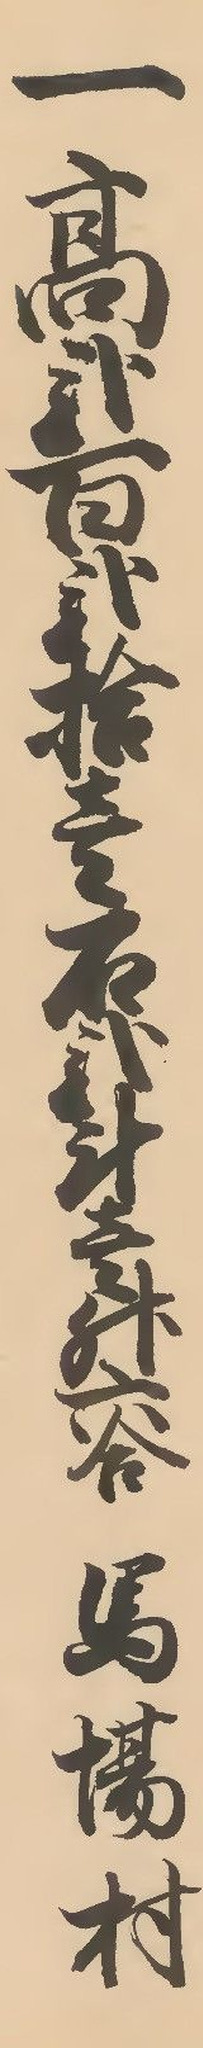一髙弐百弐拾壱石弐斗弐升六合馬場村
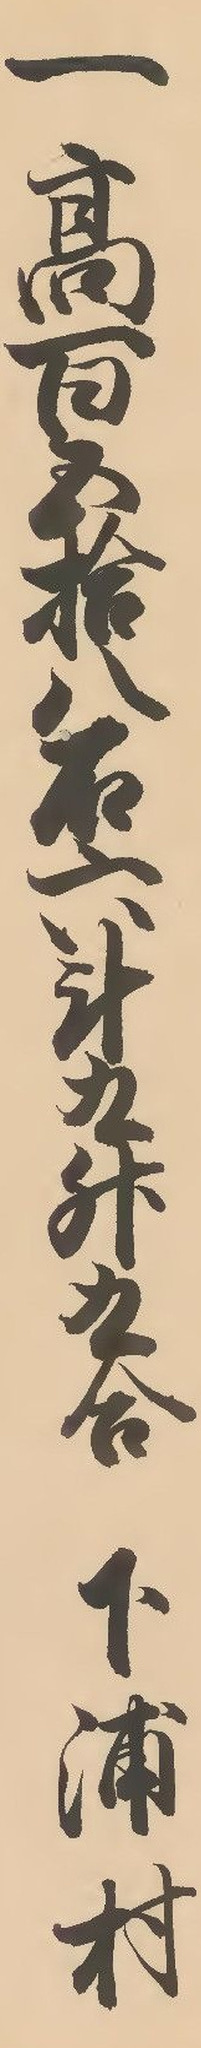一髙百五拾八石六斗九升九合下浦村
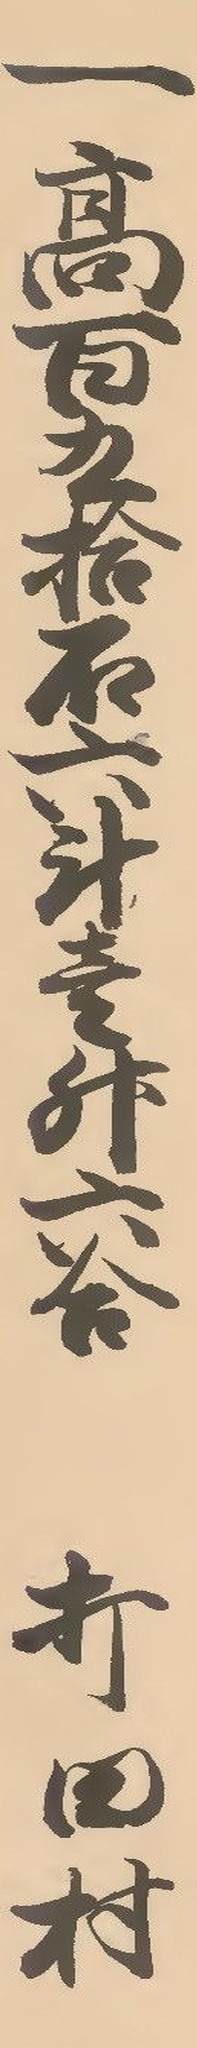一髙百九拾石六斗壱升六合打田村
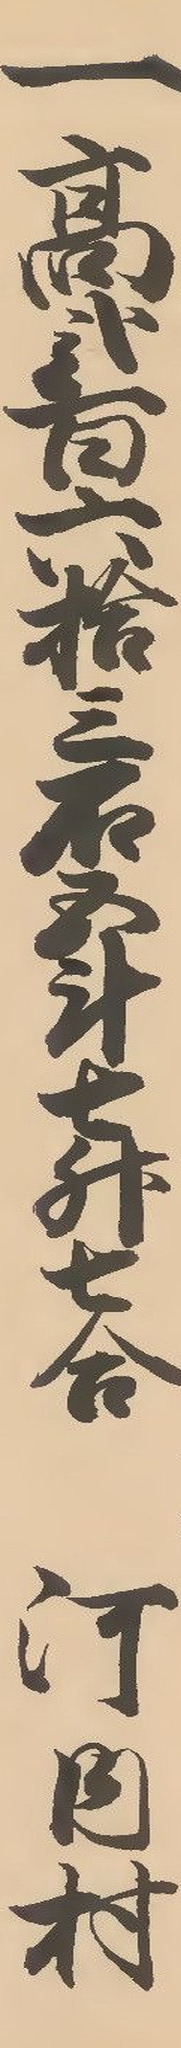一髙弐百六拾三石五斗七升七合河内村
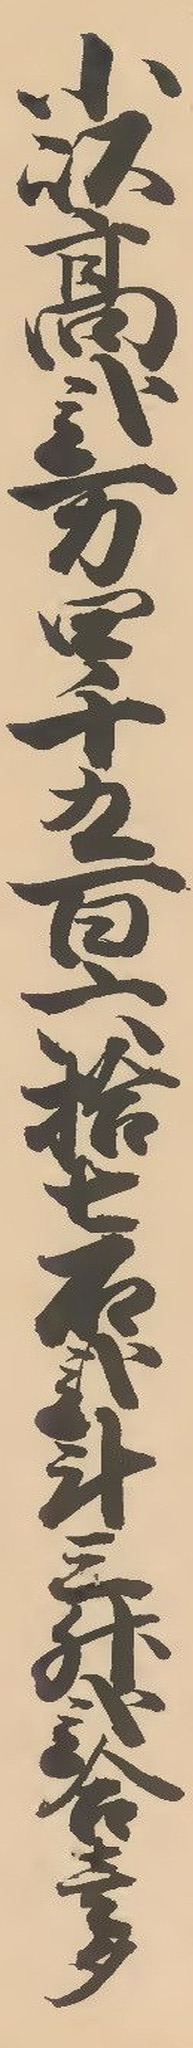小以髙弐万四千九百六拾七石弐斗三升弐合壱夕

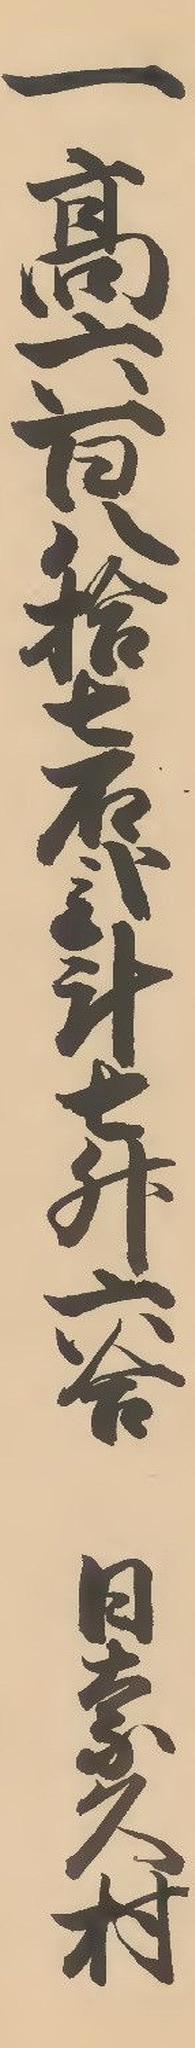一髙六百八拾七石弐斗七升六合日奈久村
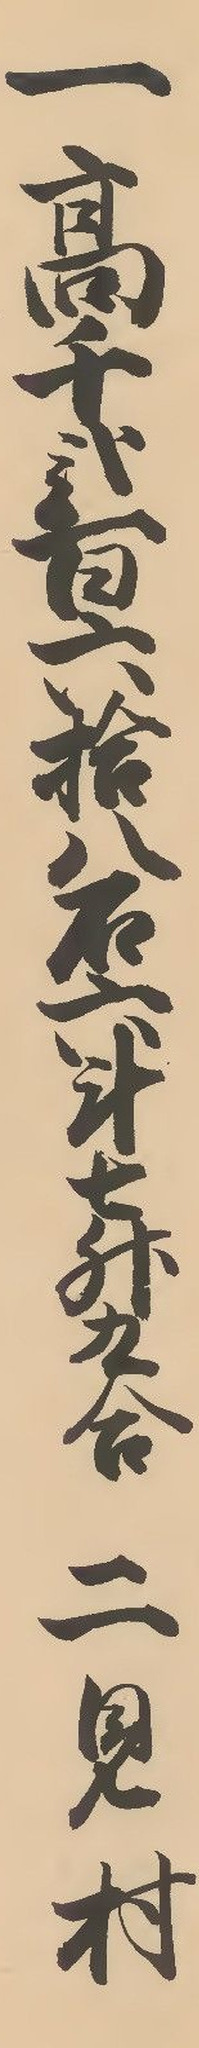一髙千弐百六拾八石六斗七升九合二見村
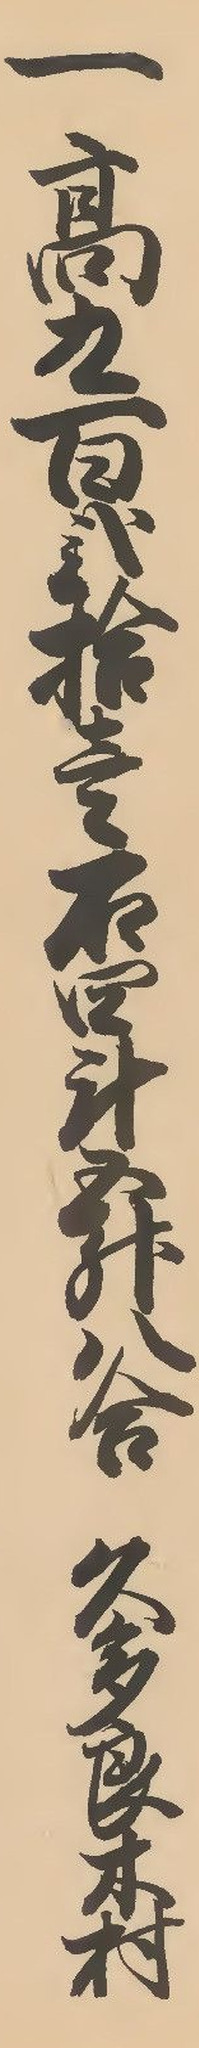一髙九百弐拾壱石四斗五升八合久夛良木村
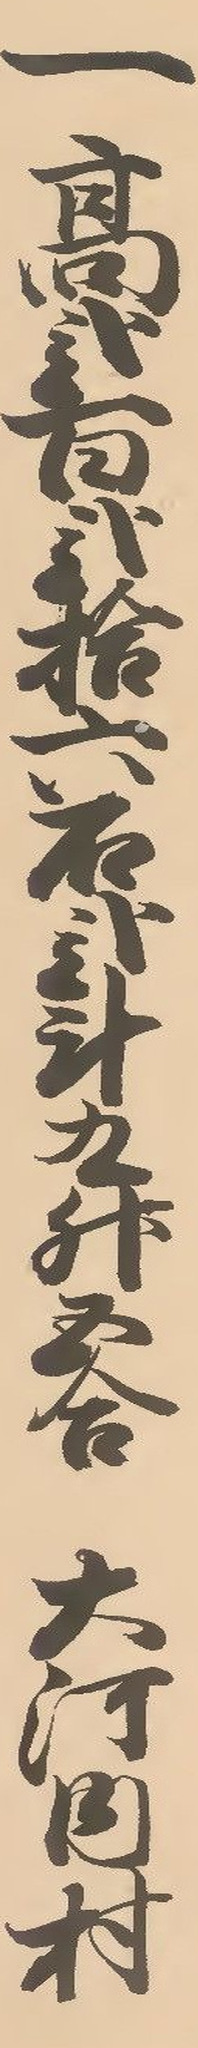一髙弐百弐拾六石弐斗九升五合大河内村
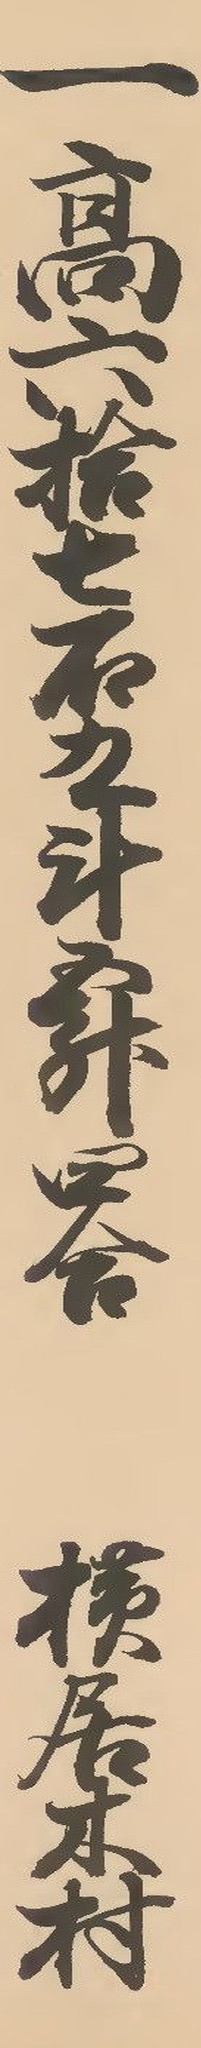一髙六拾七石九斗五升四合横居木村
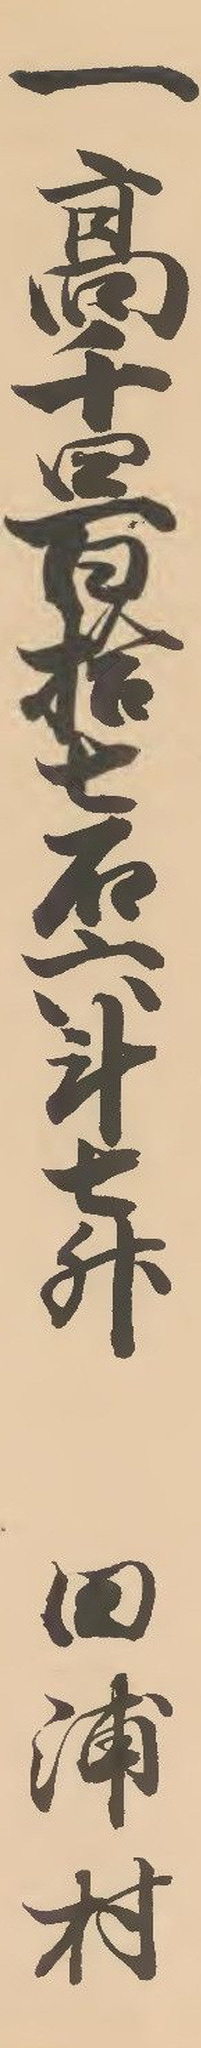一髙千四百拾七石六斗七升田浦村
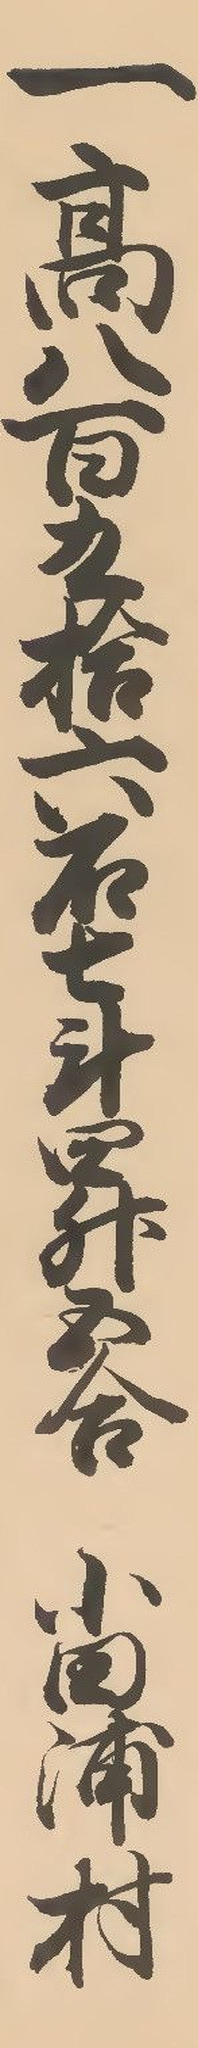一髙八百九拾六石七斗四升五合小田浦村

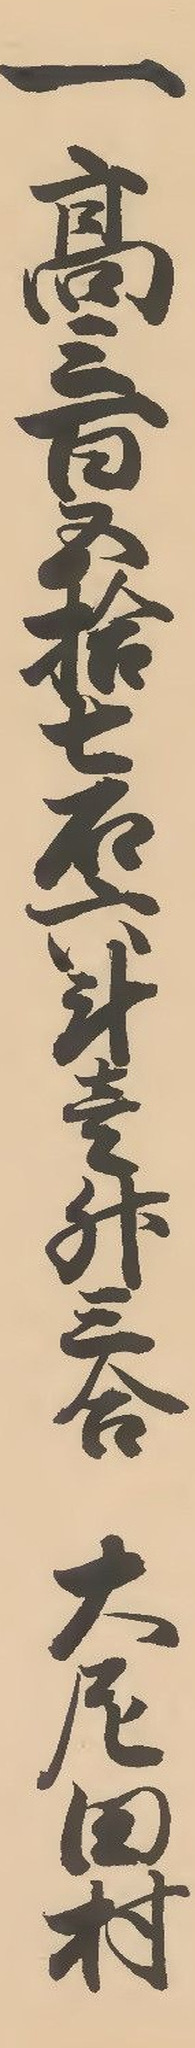一髙三百五拾七石六斗壱升三合大尼田村
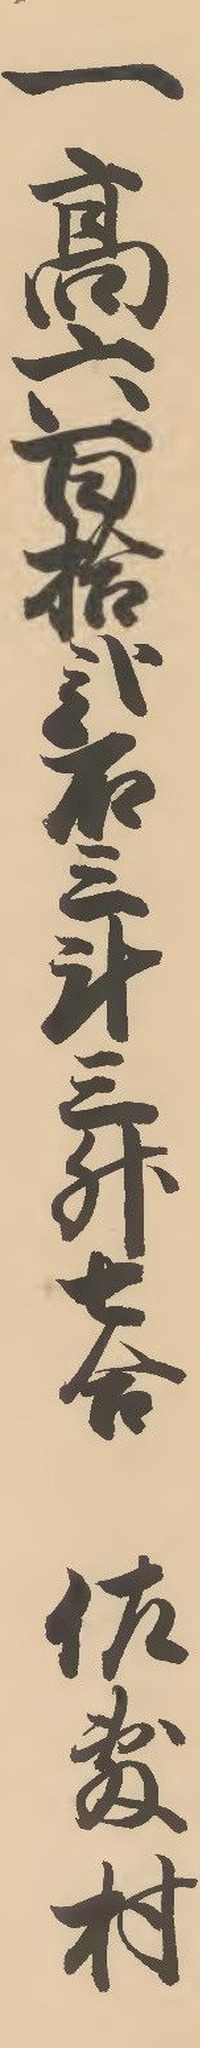一髙六百拾弐石三斗三升七合佐敷村
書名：肥後国郷帳
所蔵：国立公文書館 National Archives of Japan
